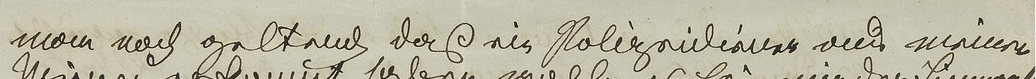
man noch geltend, daß ein Polizeidiener aus meinen
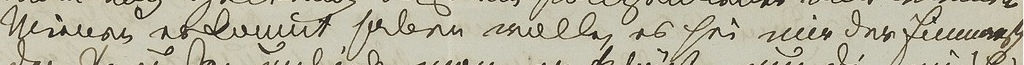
Mienen erkannt haben wolle, es sei mir der Einmarsch
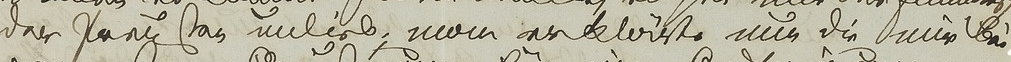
der Preußen unlieb; man erklärte nun die mir bei-
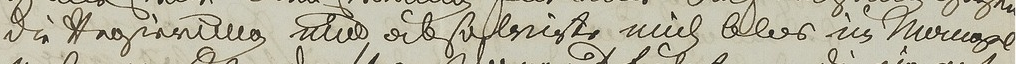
die Regierung und absolvirte mich blos im Mangel
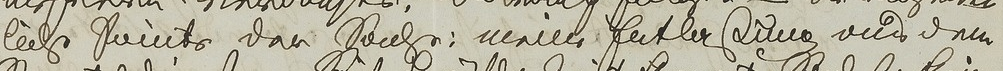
liche Pointe der Sache: meine Entlaßung aus dem
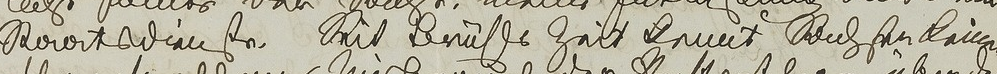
Staatsdienste. Seit Brühls Zeit kennt Sachsen keinen
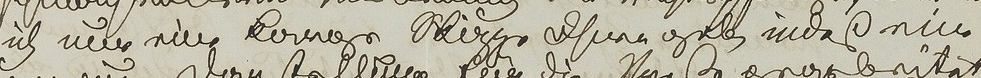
ich nur eine karge Skizze Ihnen gebe, indeß eine
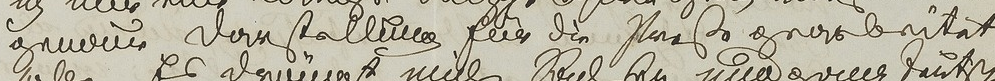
genaue Darstellung für die Preße gearbeitet
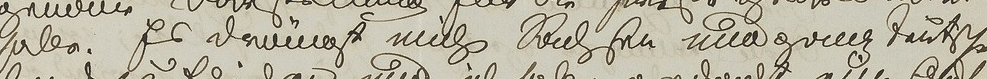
habe. Es drängt mich, Sachsen und ganz Teutsch-
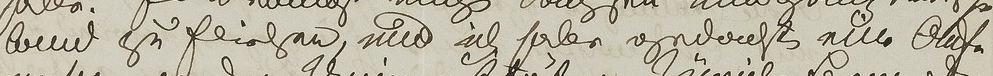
land zu fliehen, und ich habe gedacht, eine Auf-
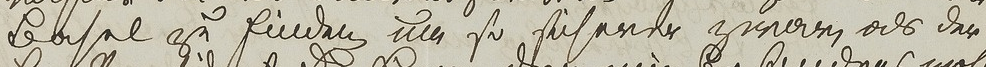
Basel zu finden, um so sicherer zwar, als der
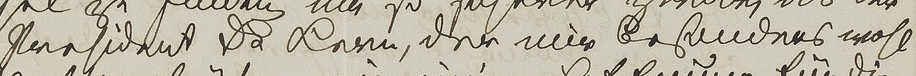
President Dr Kern, der mir besonders wohl
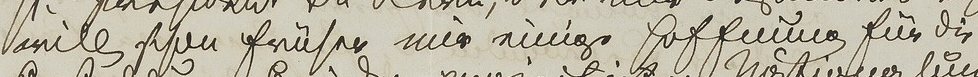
will, schon früher mir einige Hoffnung für die
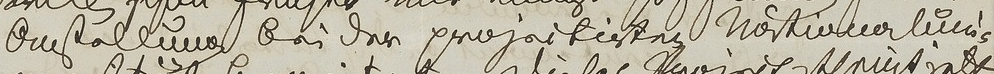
Anstellung bei der projectirten Nationaluni-
